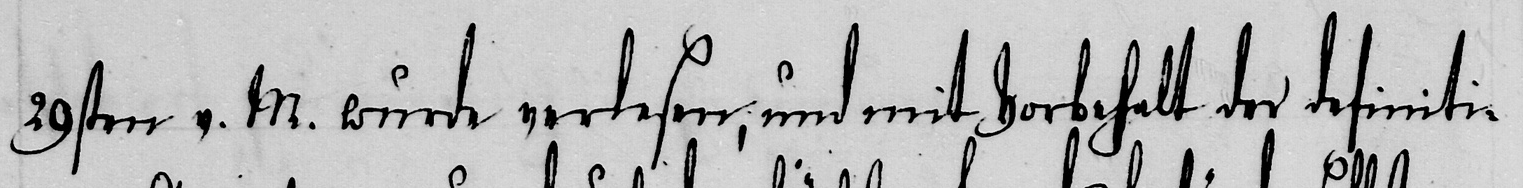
29. v. M. wurde verlesen, und mit Vorbehalt der definiti¬
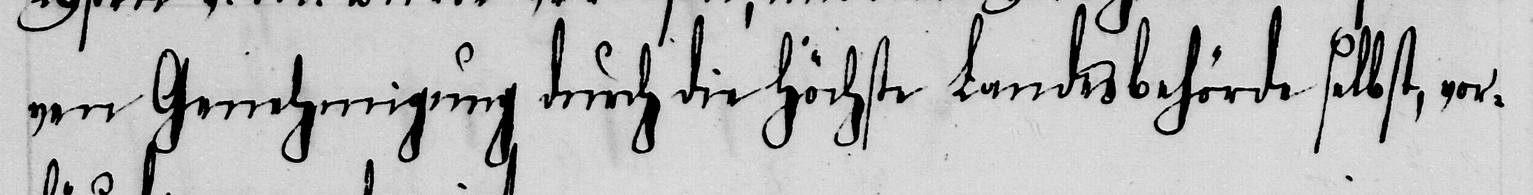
ven Genehmigung durch die Höchste Landesbehörde selbst, v¬
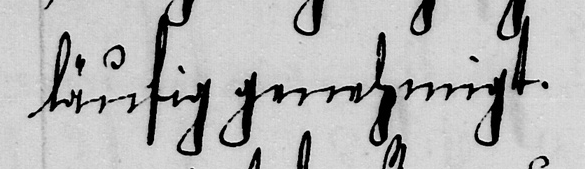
läufig genehmigt.
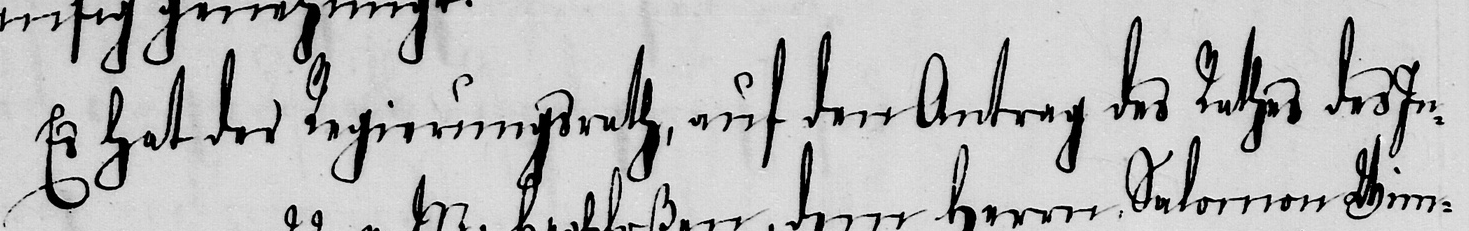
Es hat der Regierungsrath, auf den Antrag des Rathes des I¬
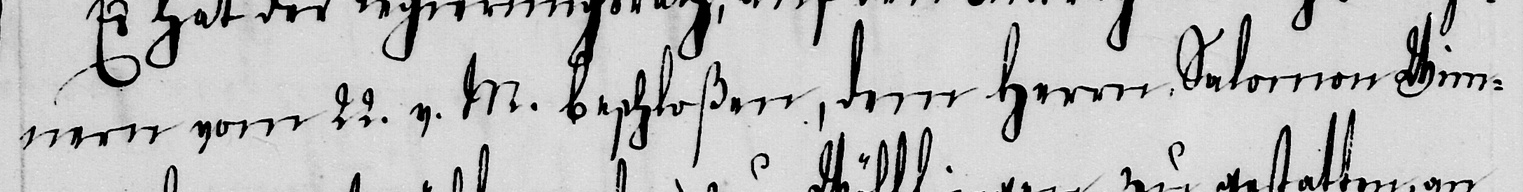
nnern vom 22. v. M. beschloßen, dem Herrn Salomon Wim¬
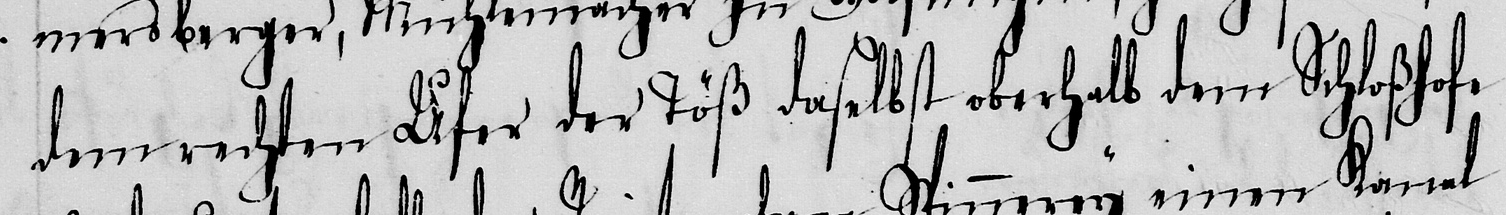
dem rechten Ufer der Töß daselbst oberhalb dem Schloßhofe
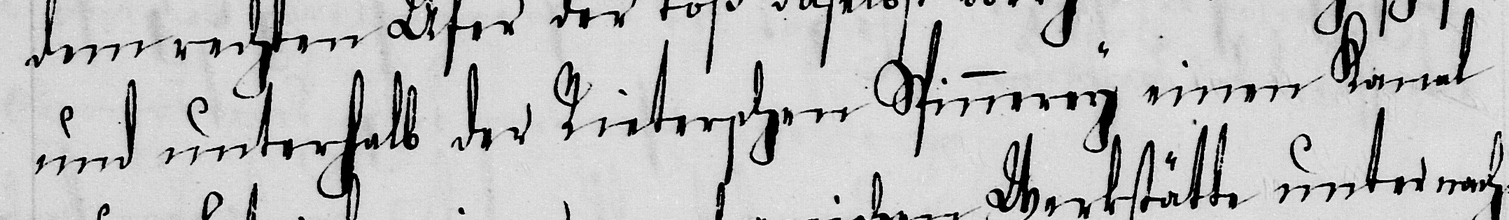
und unterhalb der Rieterschen Spinnerey einen Kanal
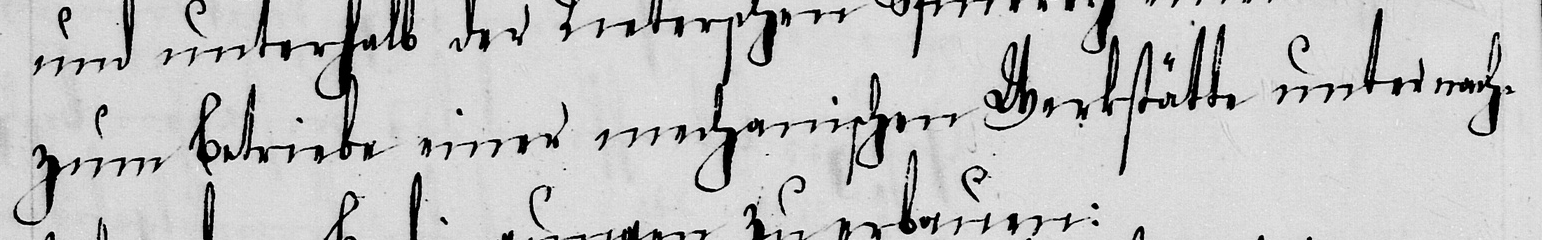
zum Betriebe einer mechanischen Werkstätte unter nach¬
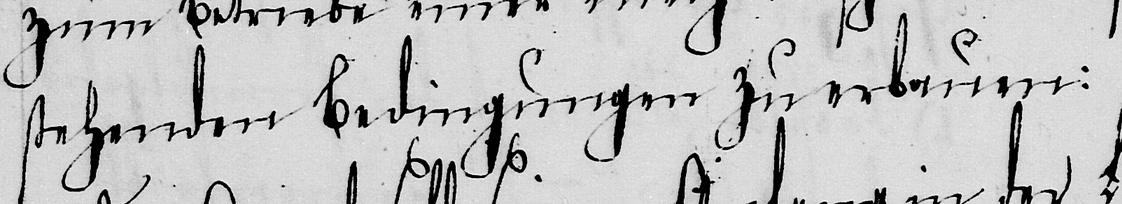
stehenden Bedingungen zu erbauen:
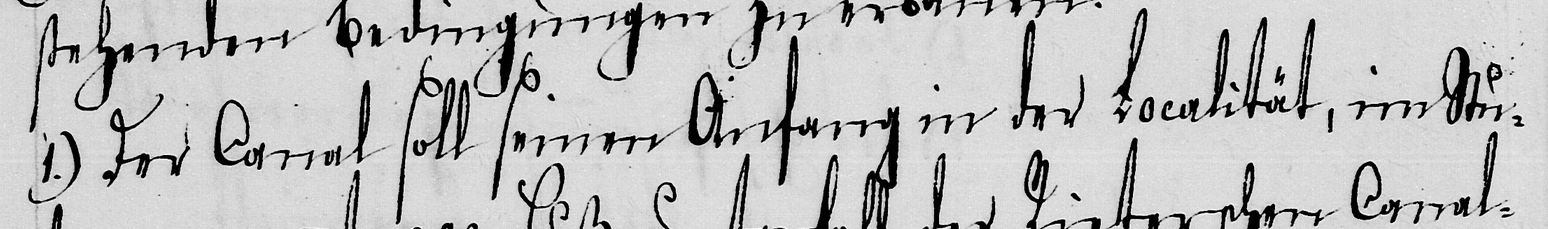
1.) Der Canal soll seinen Anfang in der Localität, im Stu¬
